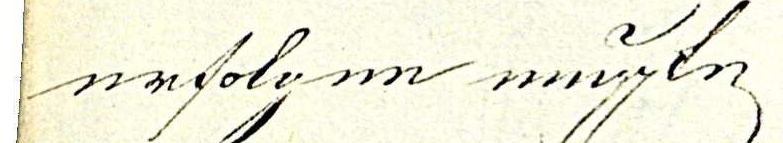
erfolgen musste.
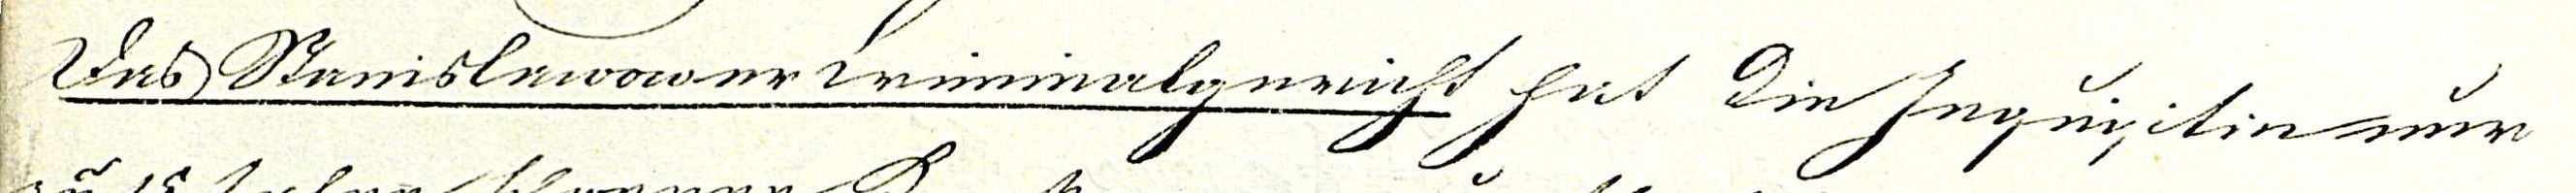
Das Stanislawower Criminalgericht hat die Inquisitin nur
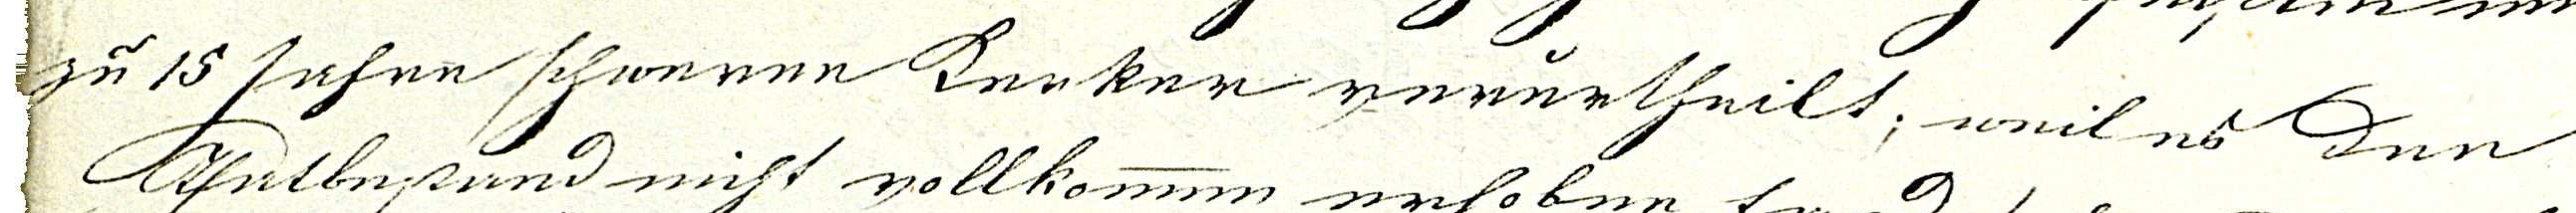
zu 15 Jahre schweren Kerker verurtheilt; weil es den
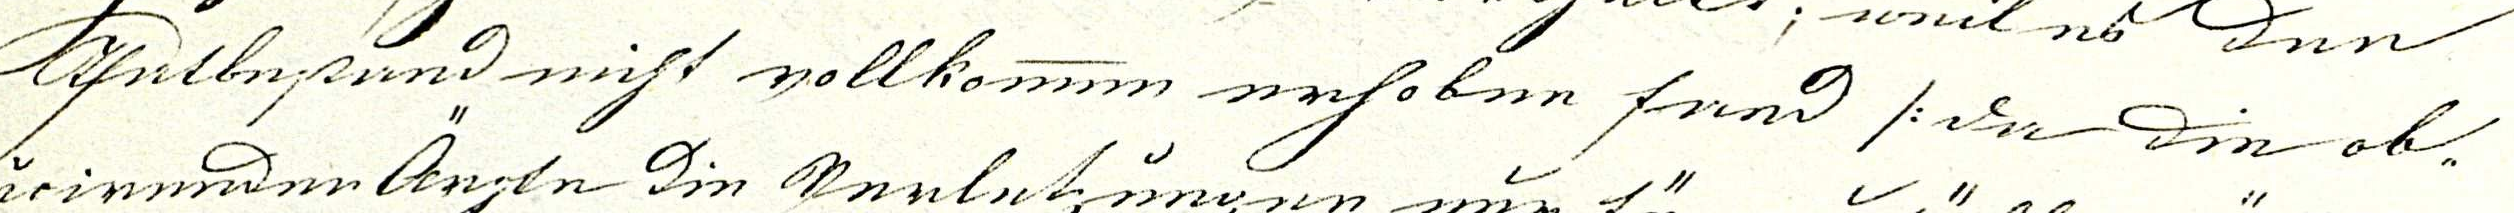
Thatbestand nicht vollkommen erhoben fand (da die ob¬
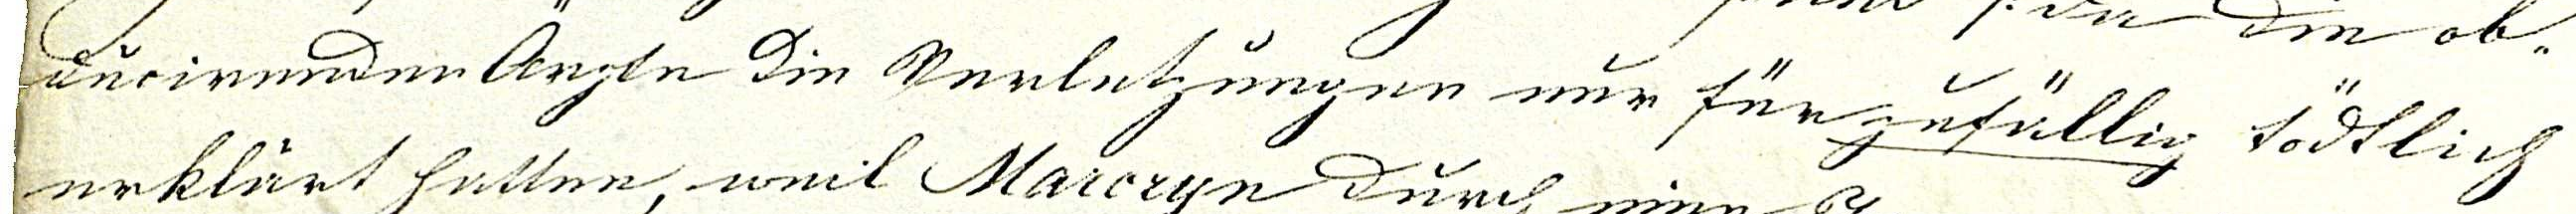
decirenden Ärzte die Verletzungen nur für zufällig tödtlich
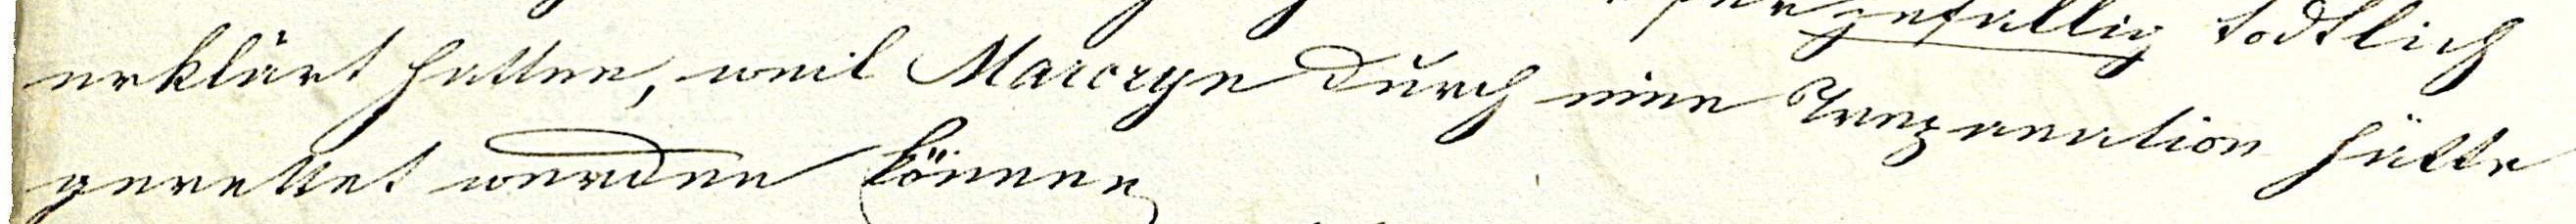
erklärt hatten, weil Marczyn durch eine Trepanation hätte
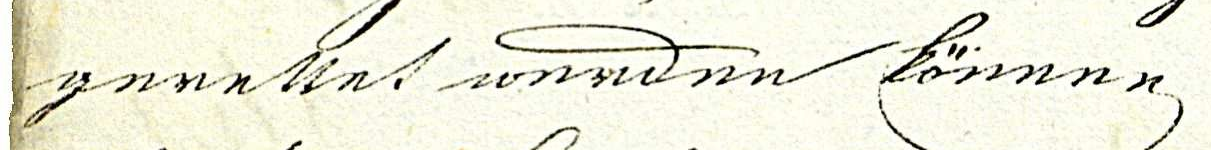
gerettet werden können.
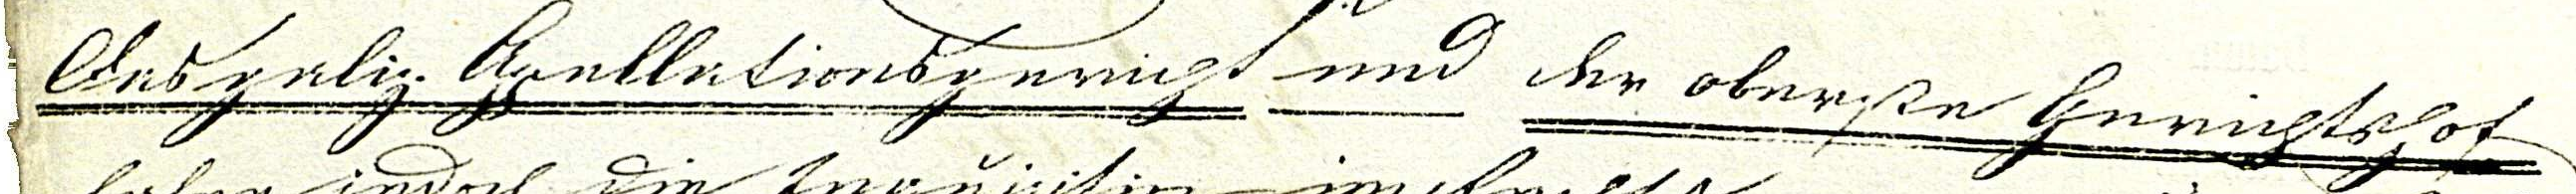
Das galiz. Appellationsgericht und der oberste Gerichtshof
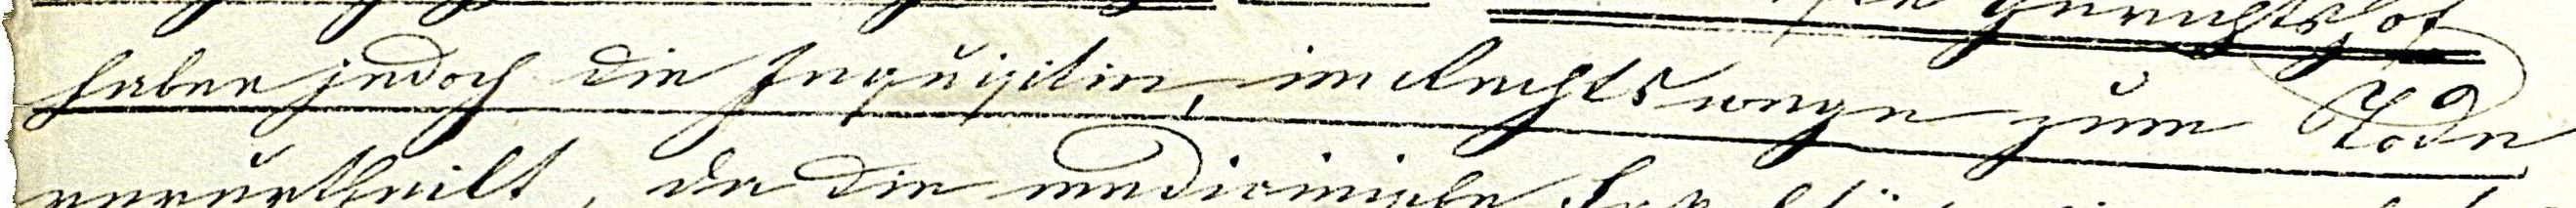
haben jedoch die Inquisitin, im Rechtswege zum Tode
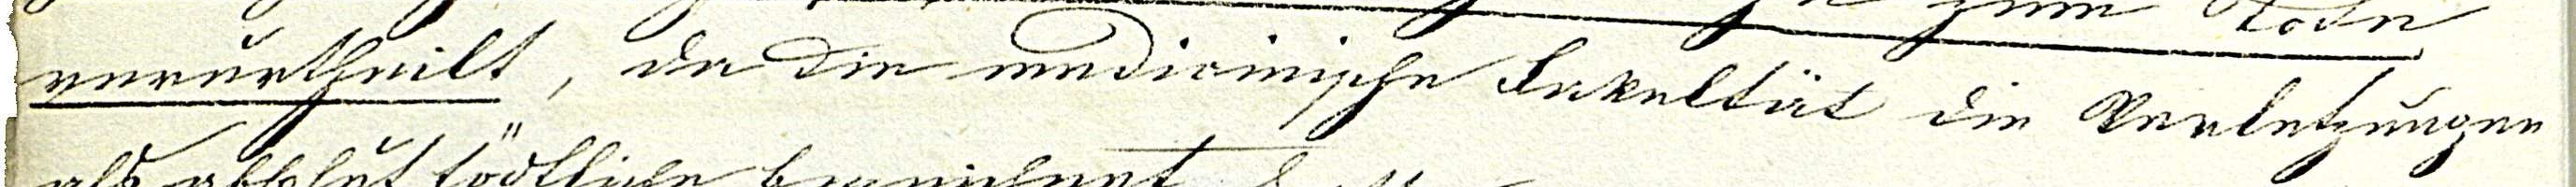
verurtheilt, da die medicinische Fakultät die Verletzungen
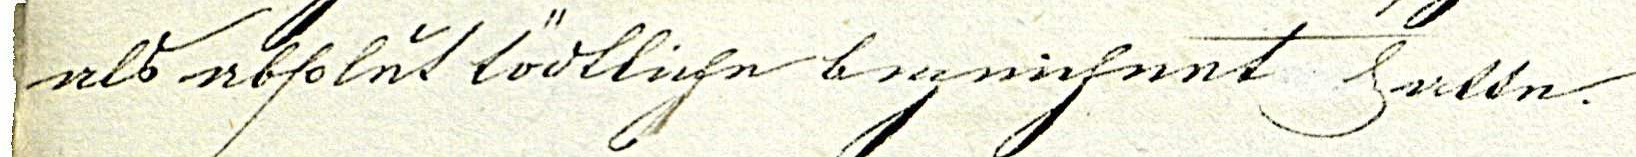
als absolut tödtliche bezeichnet hatte.
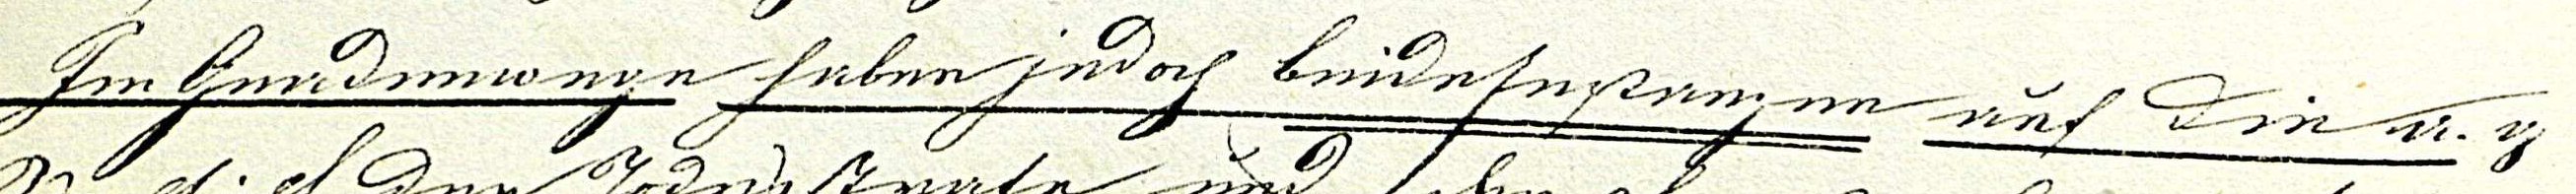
Im Gnadenwege haben jedoch beide Instanzen auf die a.g.
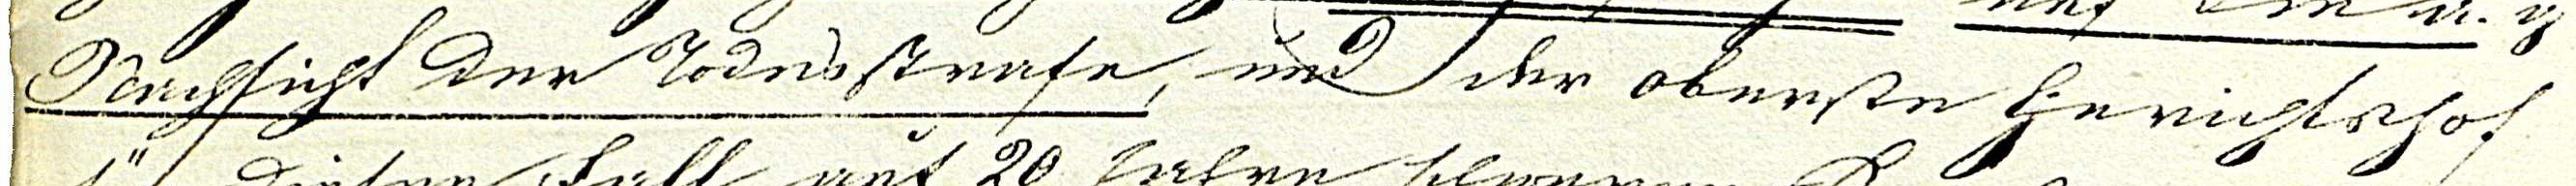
Nachsicht der Todesstrafe, und der oberste Gerichtshof
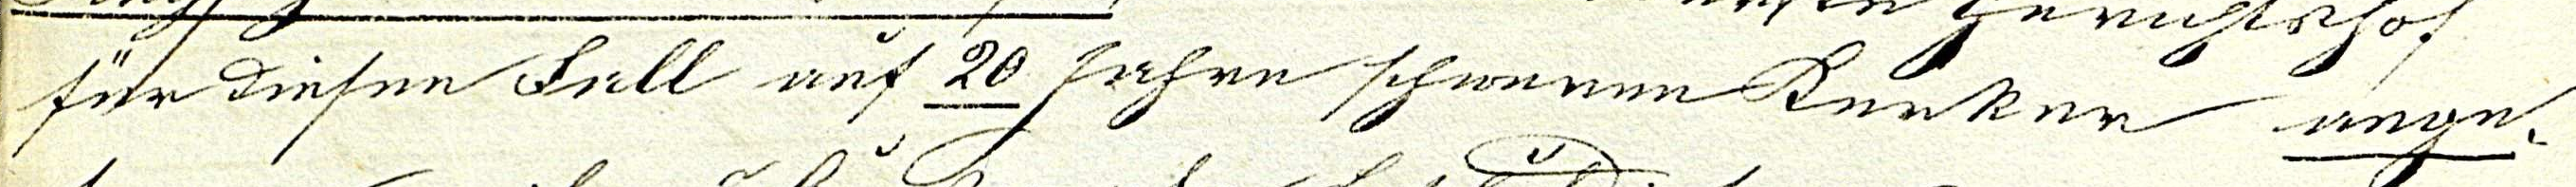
für diesen Fall auf 20 Jahre schweren Kerker ange¬
